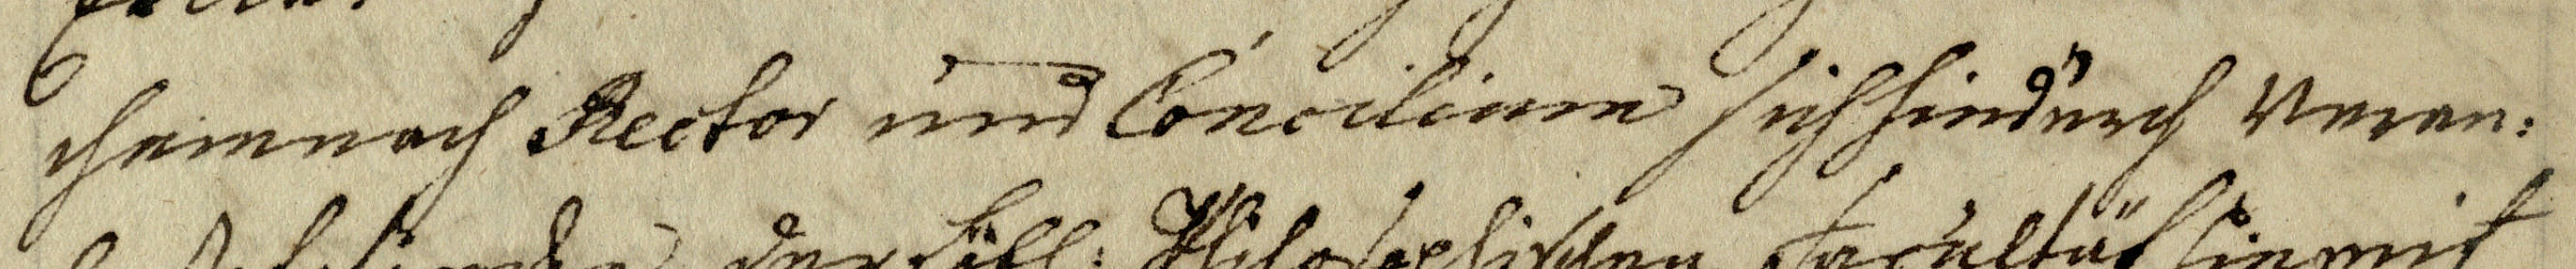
chemnach Rector und Concilium sich hiedurch veran¬
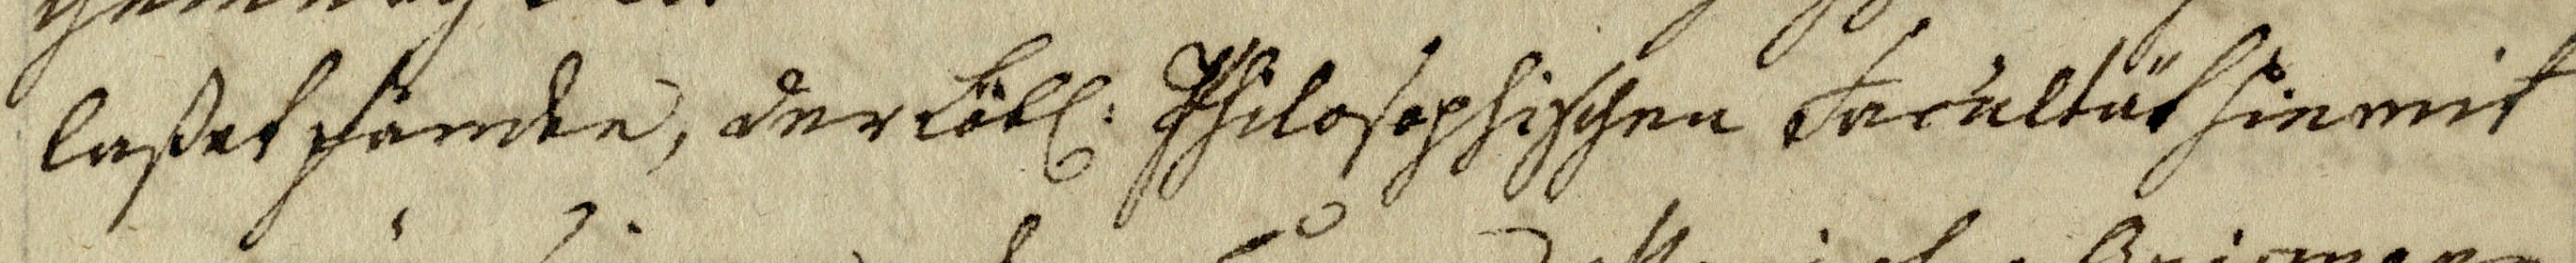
laßet fänden, der Löbl. Philosophischen Facultät hiemit
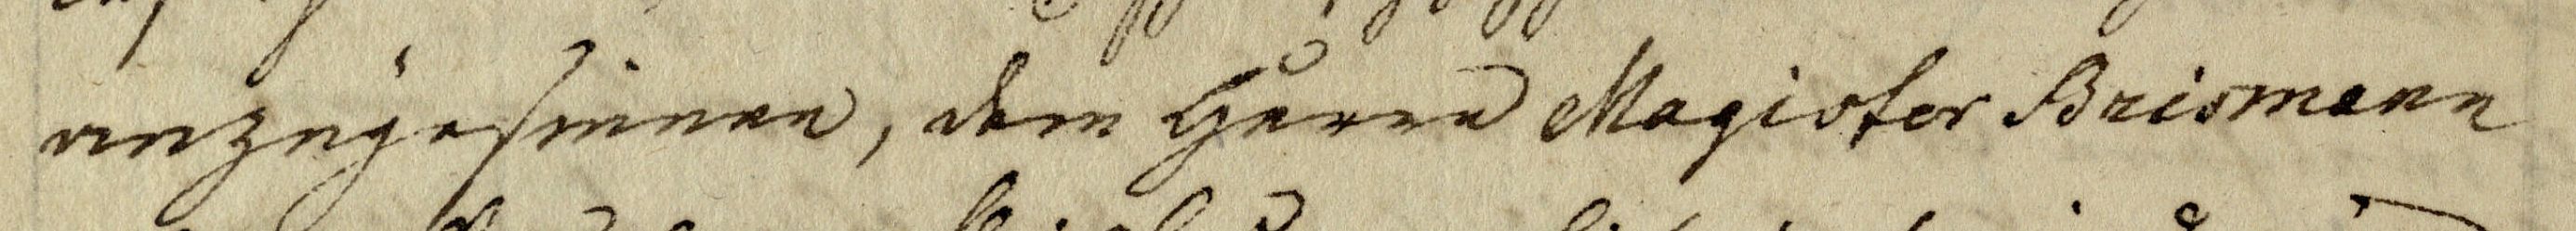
anzugesinnen, dem Herrn Magister Brismann
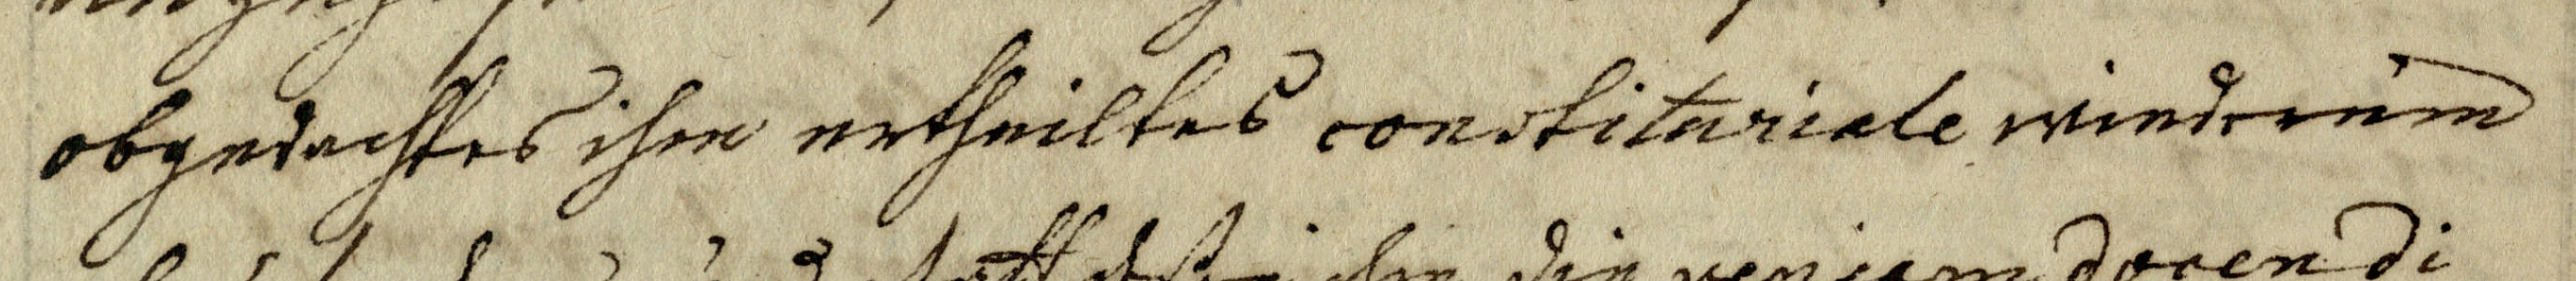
obgedachtes ihm ertheiltes constituriale wiederum
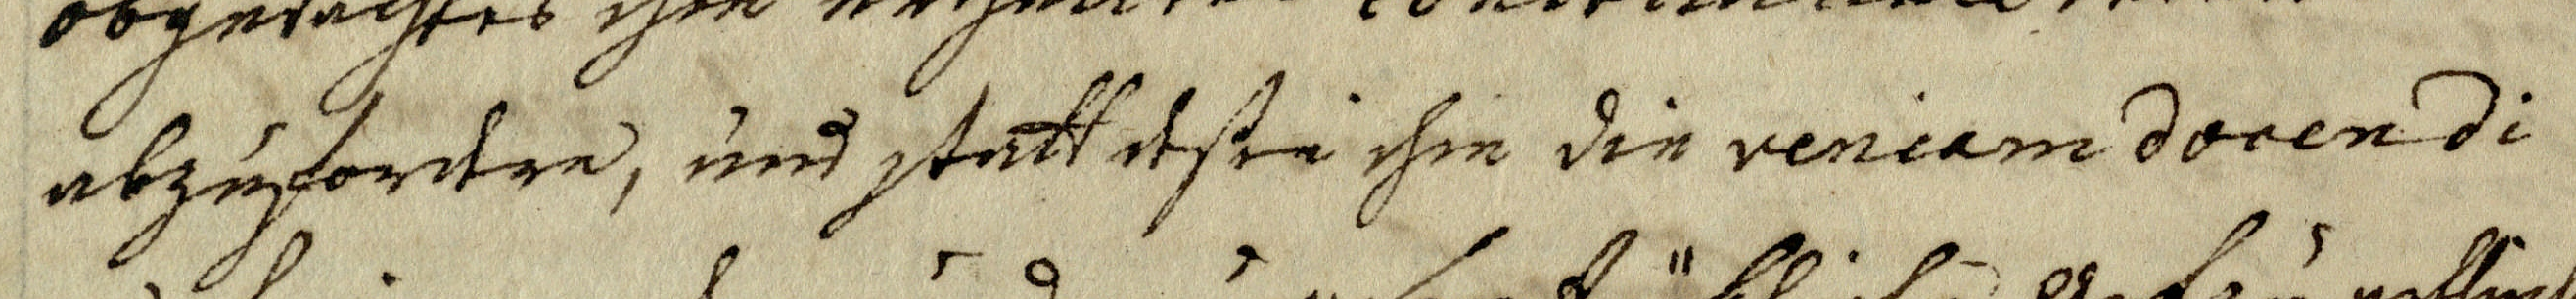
abzufordern, und statt deßen ihm die veniam docendi
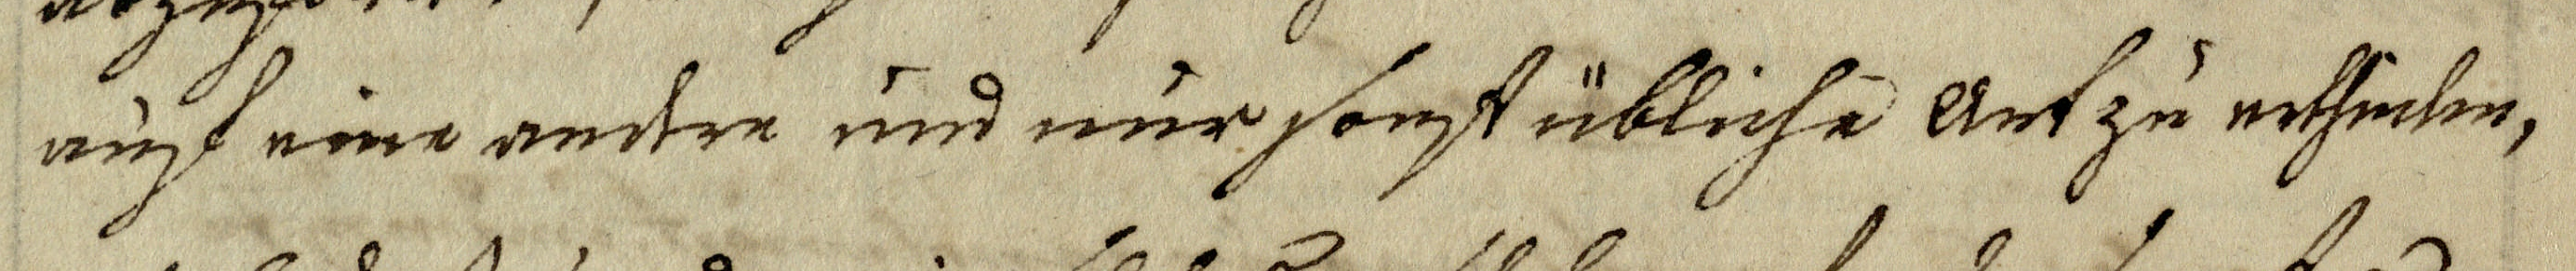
auf eine andere und nur sonst übliche Art zu ertheilen,
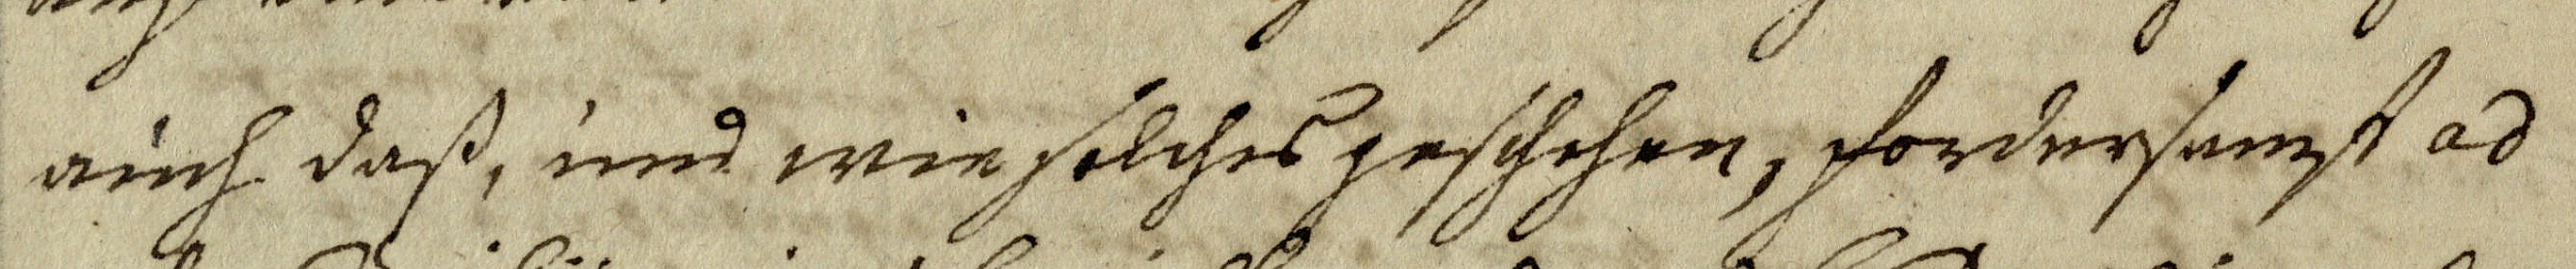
auch daß, und wie solches geschehen, fordersamst ad
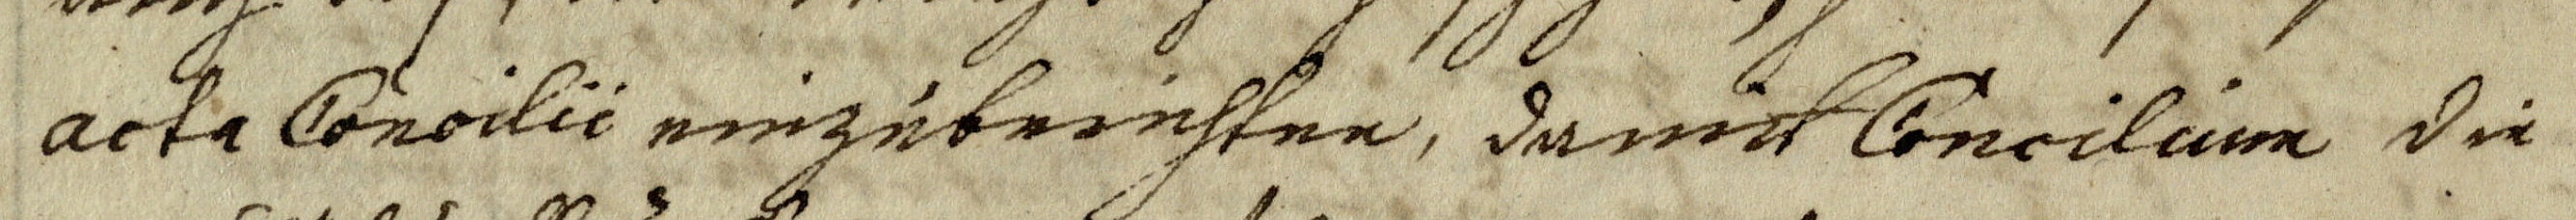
acta Concilii einzuberichten, damit Concilium die
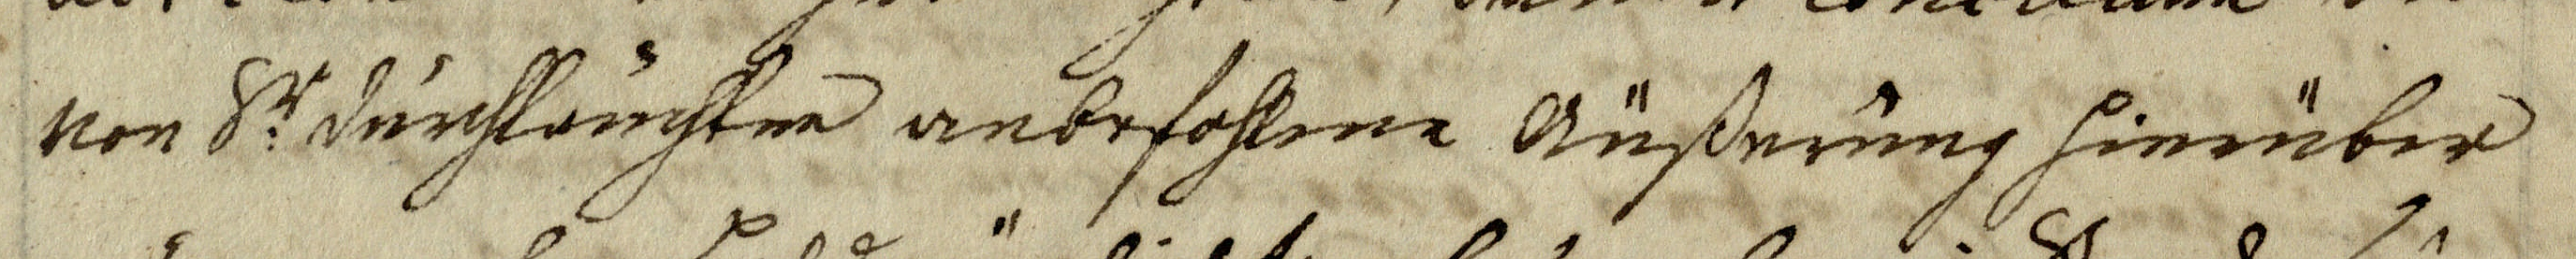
von Sr Durchlauchten anbefohlne Äußerung hierüber
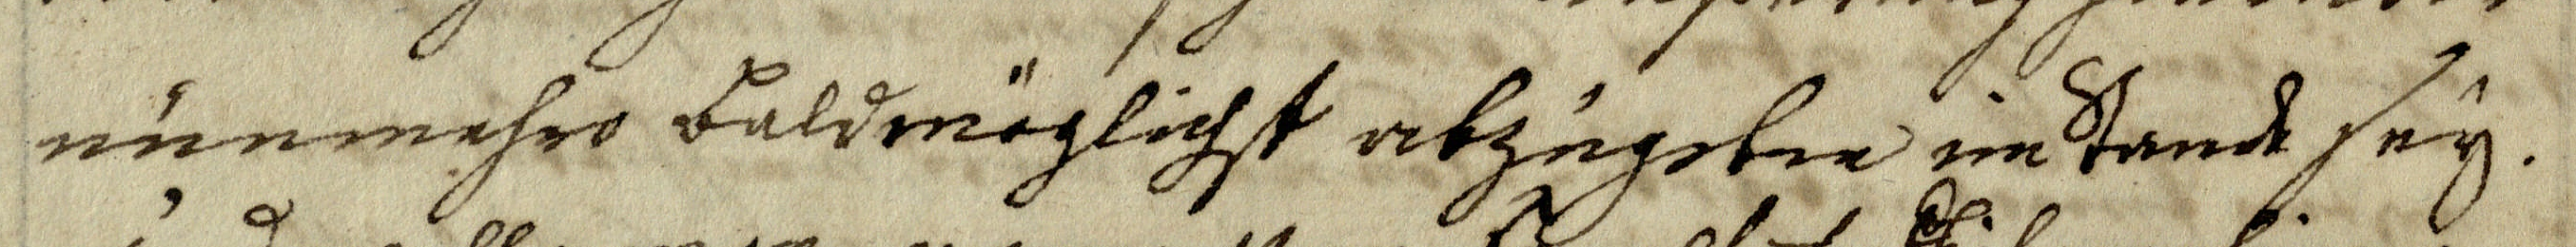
nunmehro baldmöglichst abzugeben in Stande seÿ.
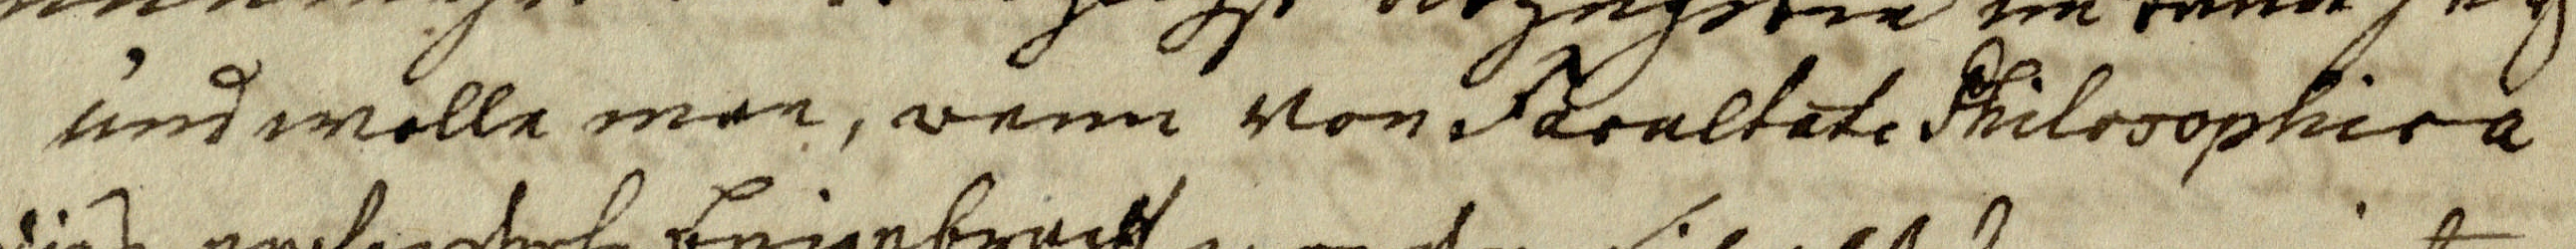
und wolle man, wenn von Facultate Philosophica
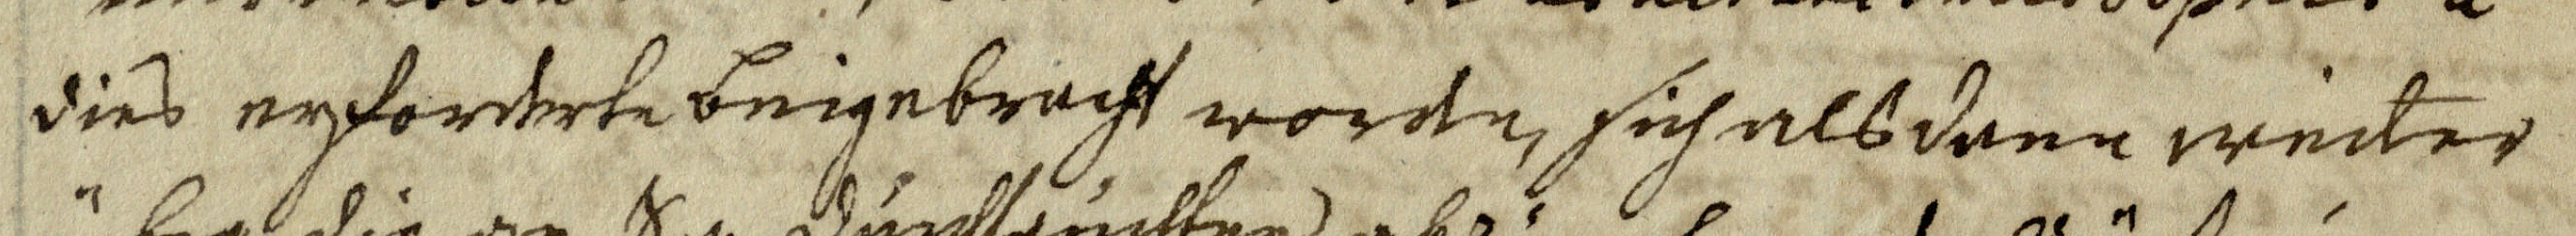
dies erforderte beigebracht worden, sich als dann weiter
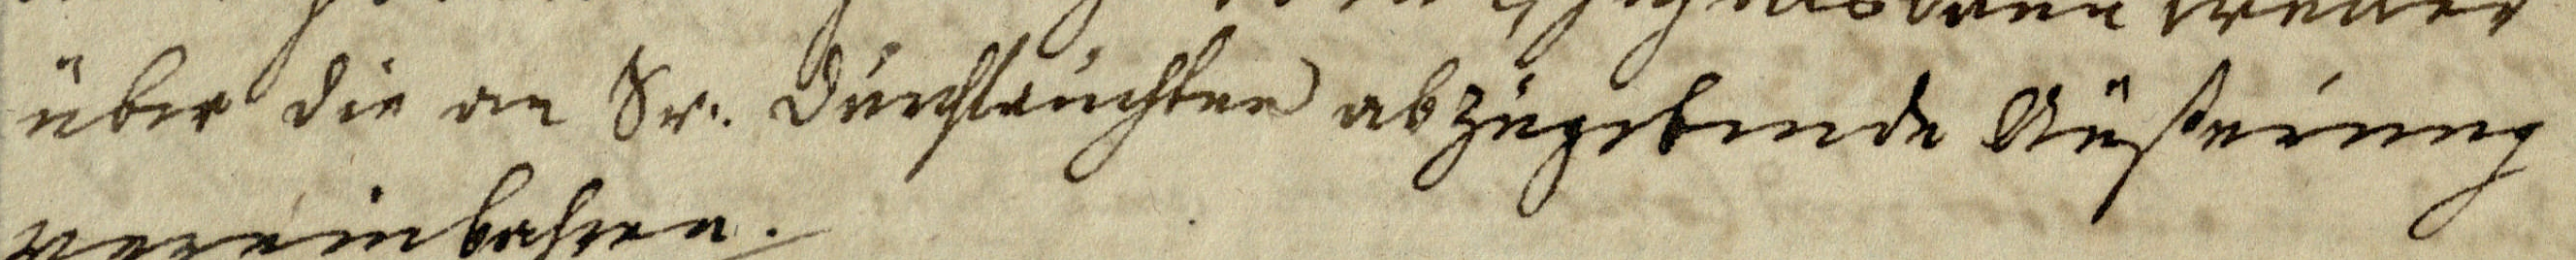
über die an Sr. Durchlauchten abzugebende Äußerung
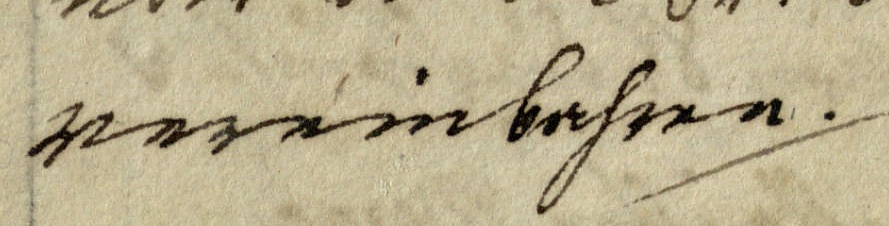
vereinbahren.
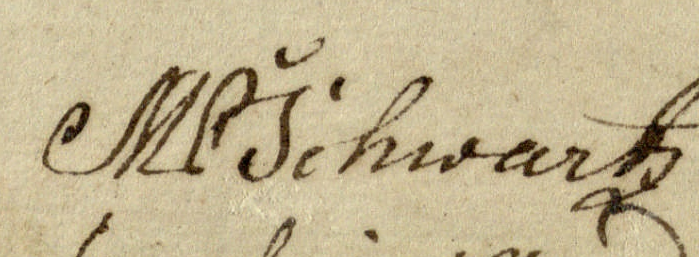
MC Schwartz
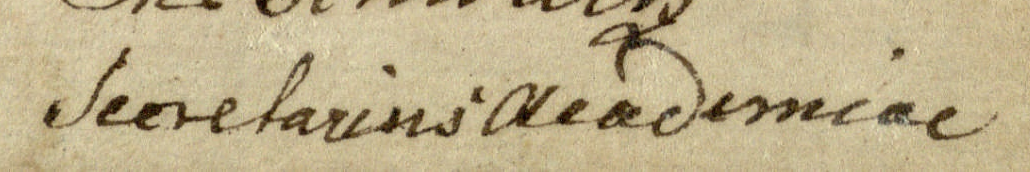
Secretarius Academiae
